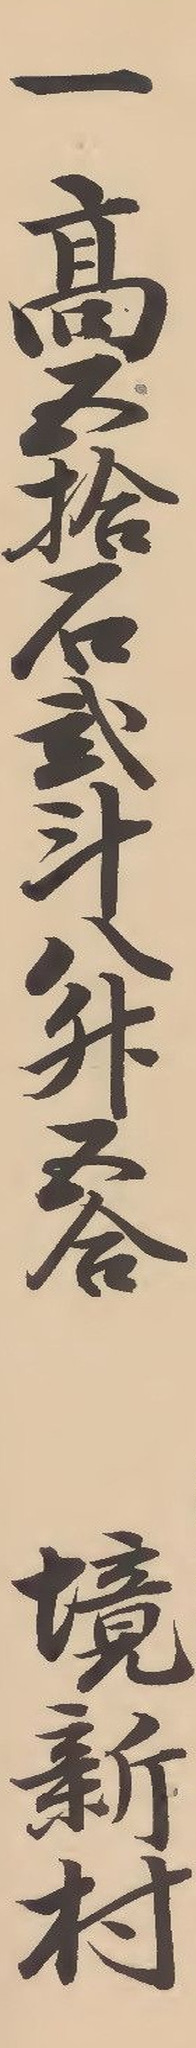一高五拾石弐斗八升五合境新村
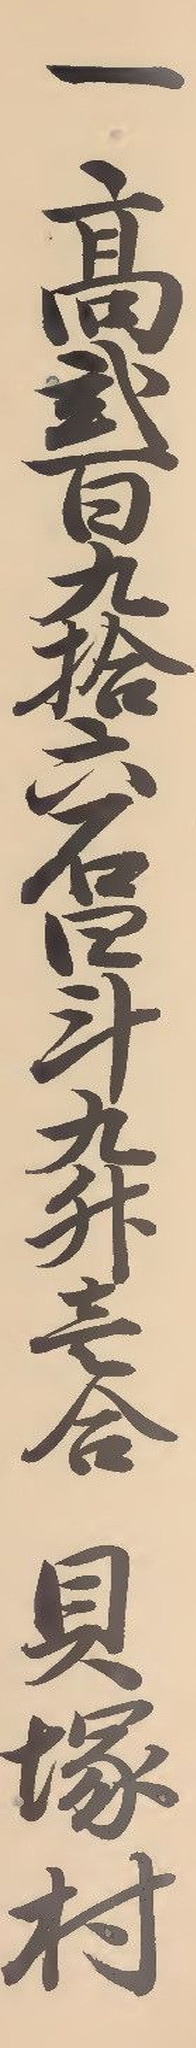一高弐百九拾六石四斗九升壱合貝塚村
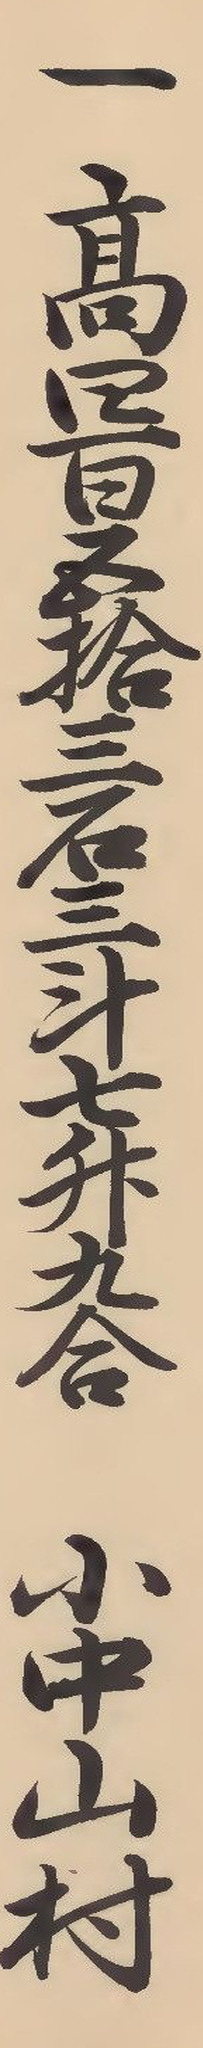一高四百五拾三石三斗七升九合小中山村
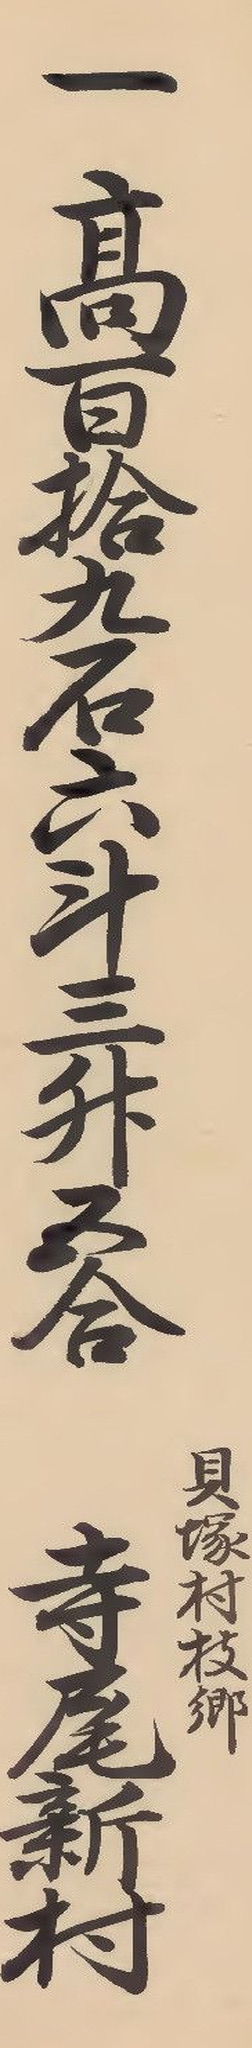一高百拾九石六斗三升五合寺尾新村
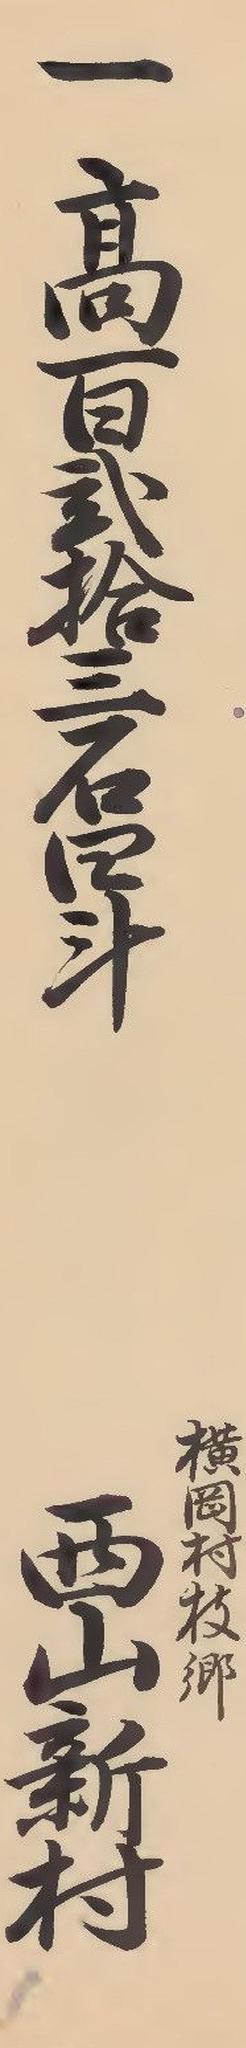一高百弐拾三石四斗西山新村

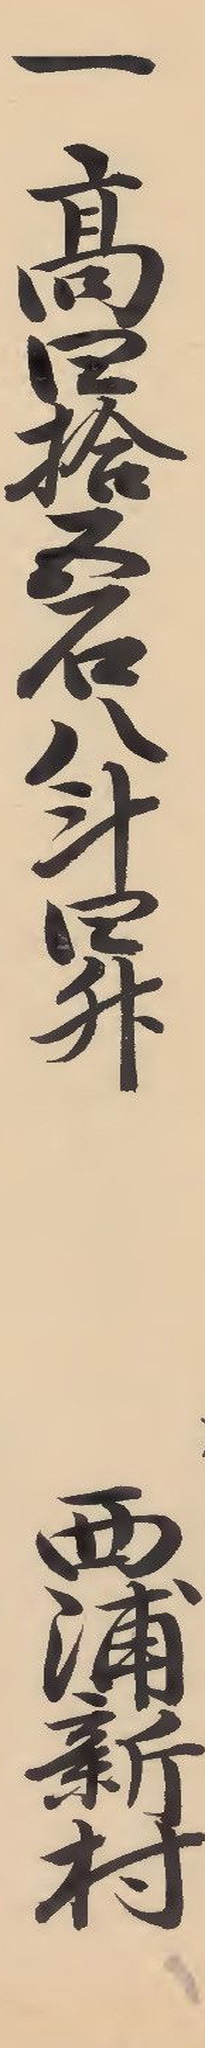一高四拾五石八斗四升西浦新村
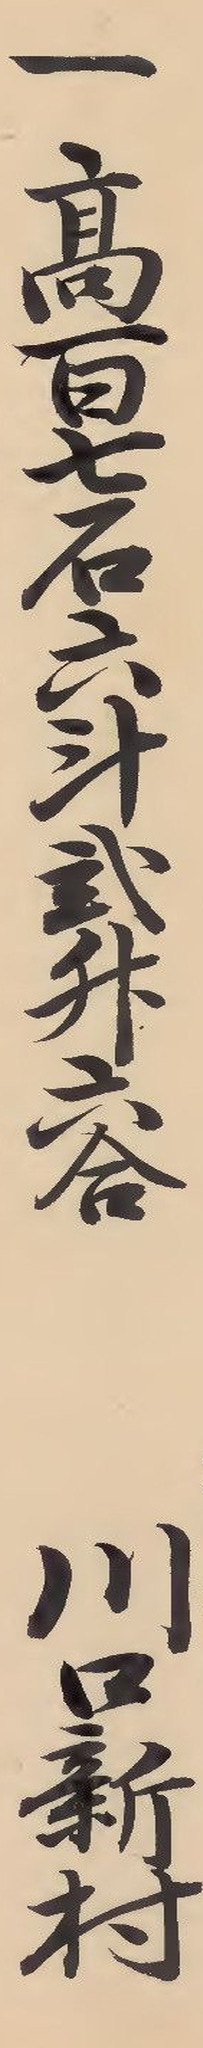一高百七石六斗弐升六合川口新村
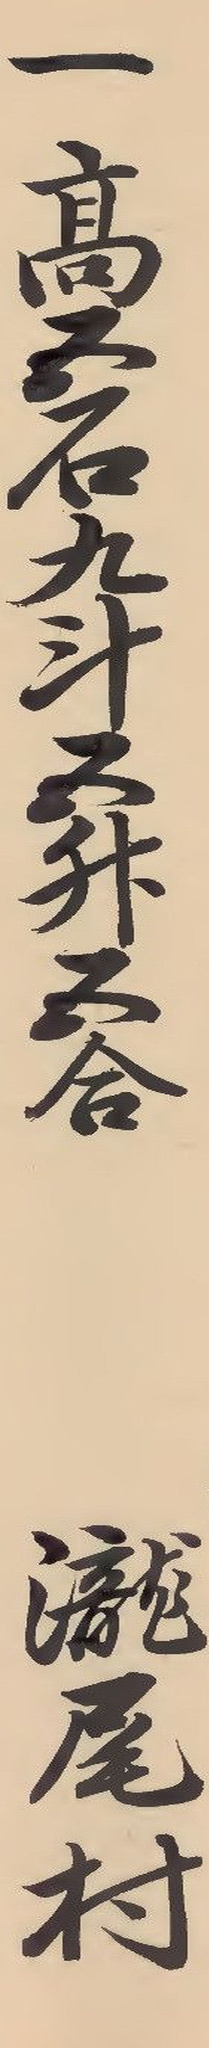一高五石九斗五升五合滝尾村
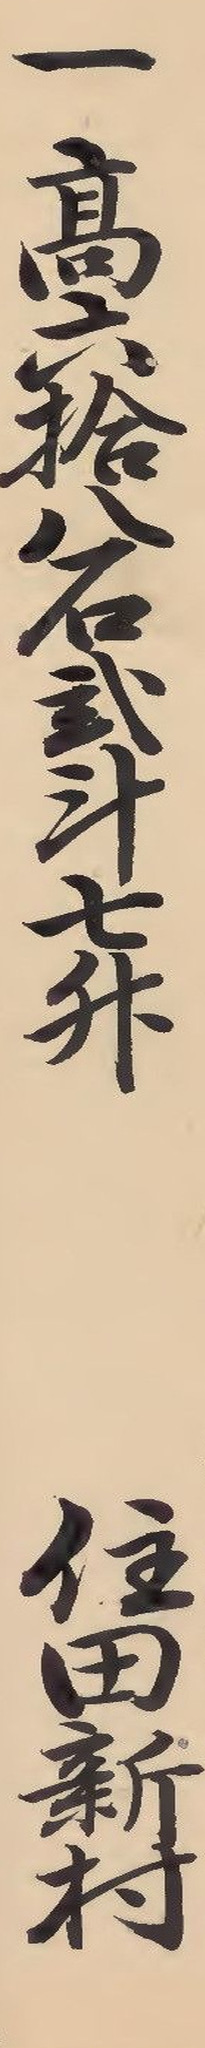一高六拾八石弐斗七升住田新村
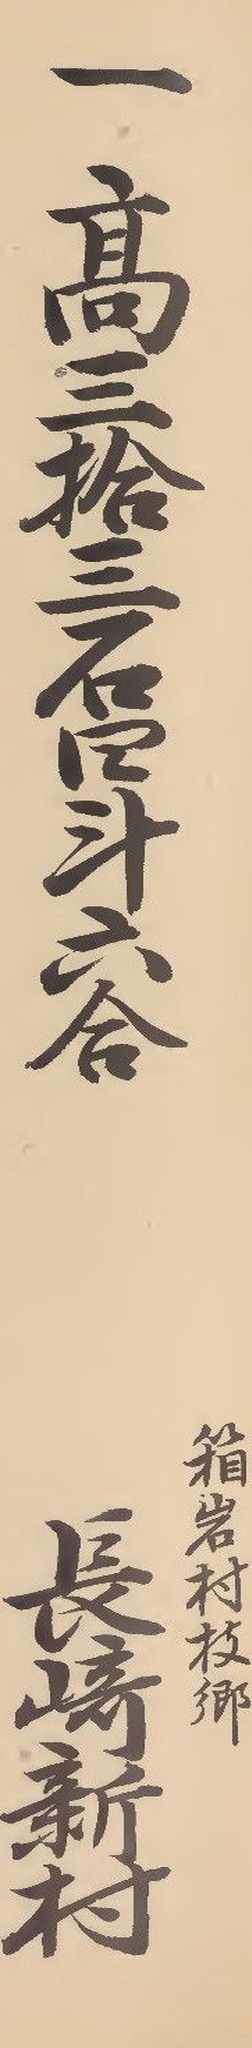一高三拾三石四斗六合長崎新村
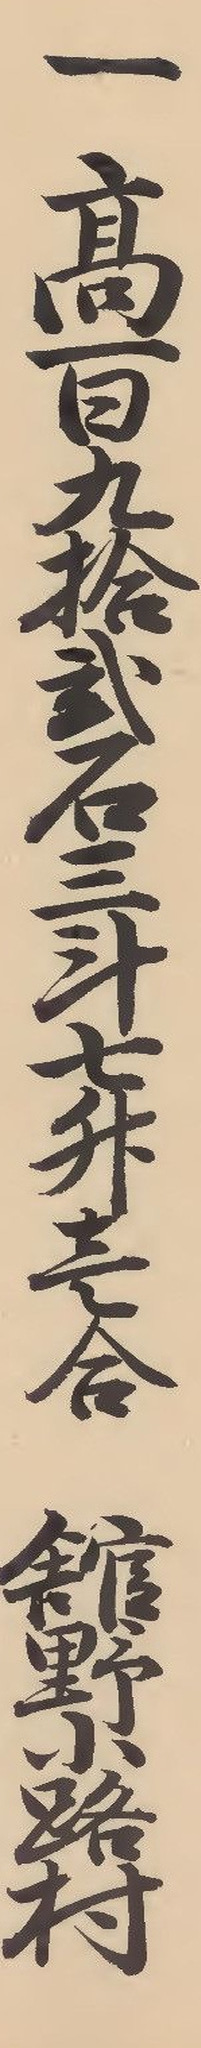一高百九拾弐石三斗七升壱合舘野小路村
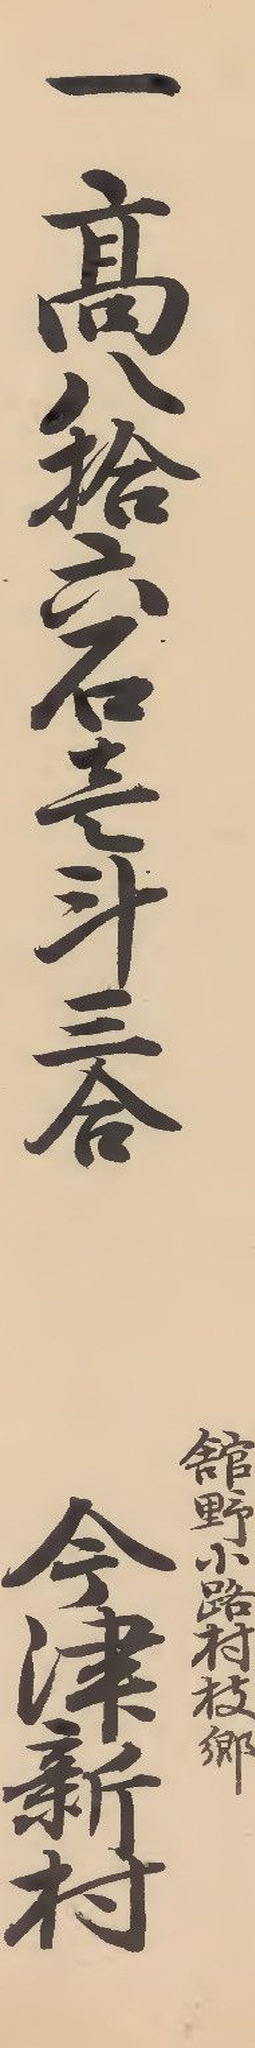一高八拾六石壱斗三合今津新村
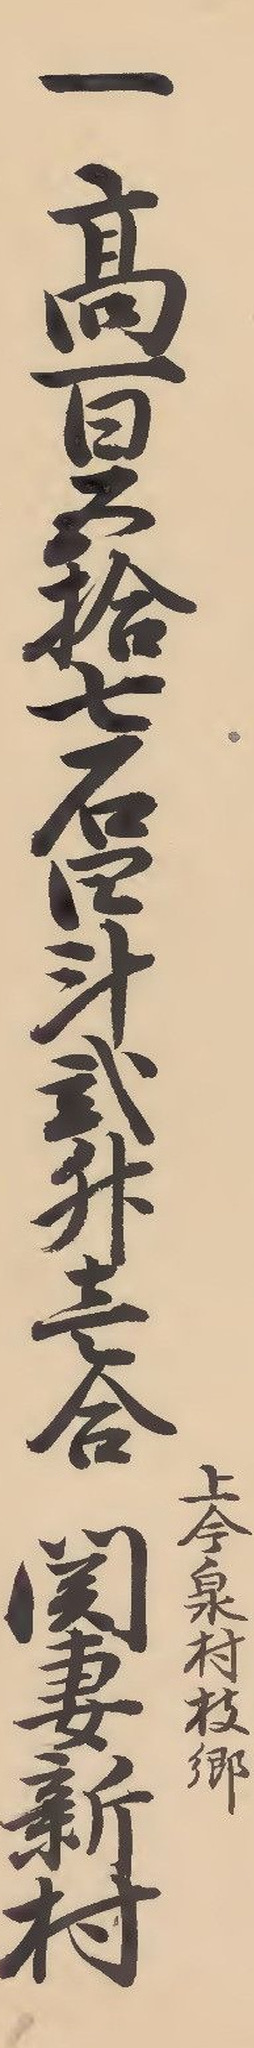一高百五拾七石四斗弐升壱合関妻新村

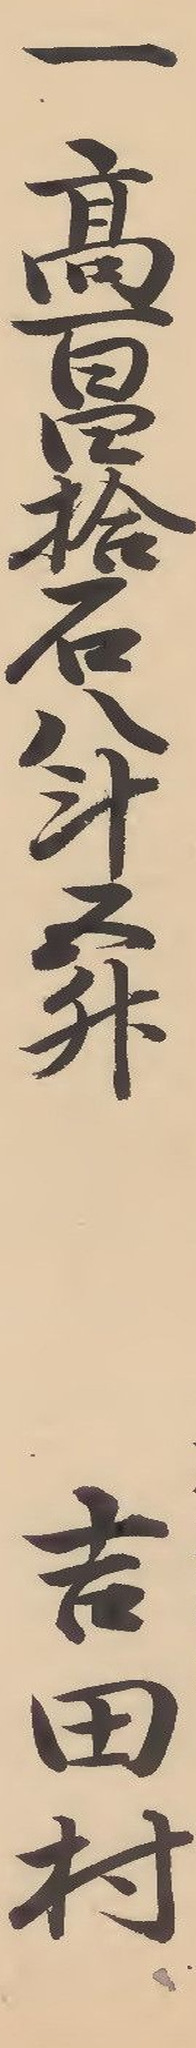一高百四拾石八斗五升吉田村
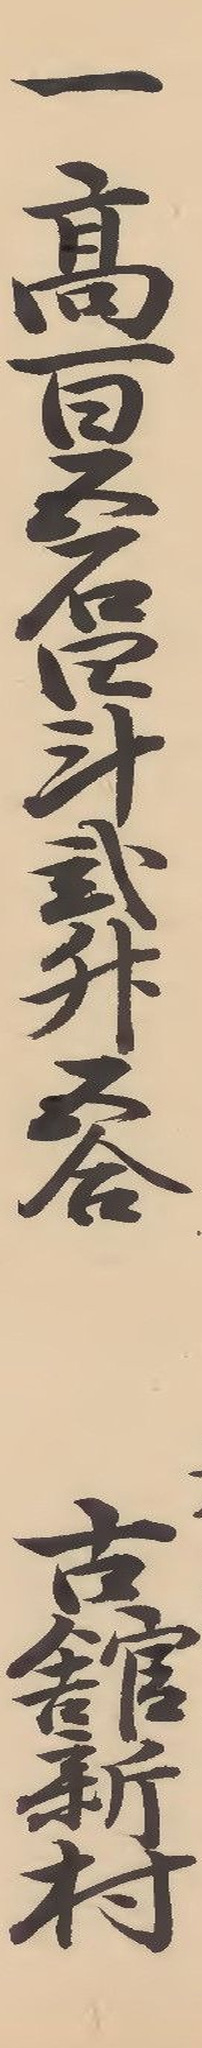一高百五石四斗弐升五合古舘新村
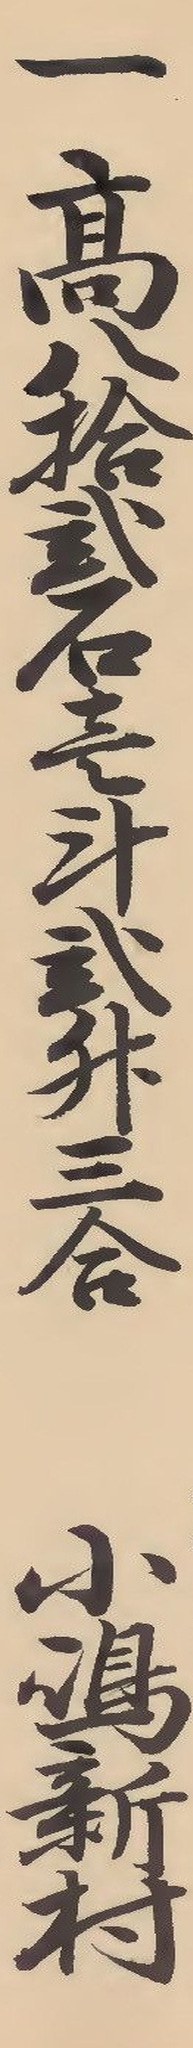一高八拾弐石壱斗弐升三合小島新村
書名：越後国郷帳　下
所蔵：国立公文書館 National Archives of Japan
